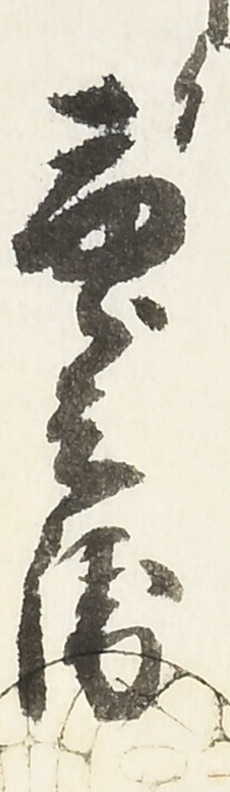徳兵衛
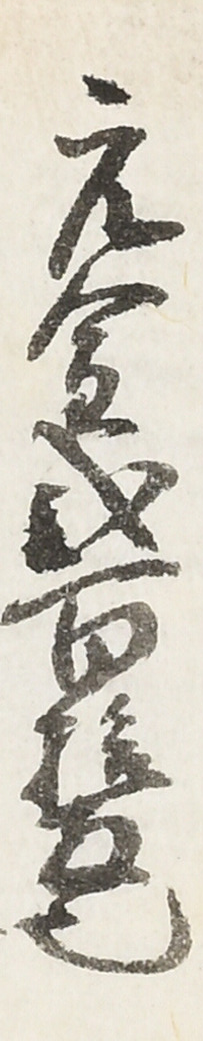元金弐百拾両也
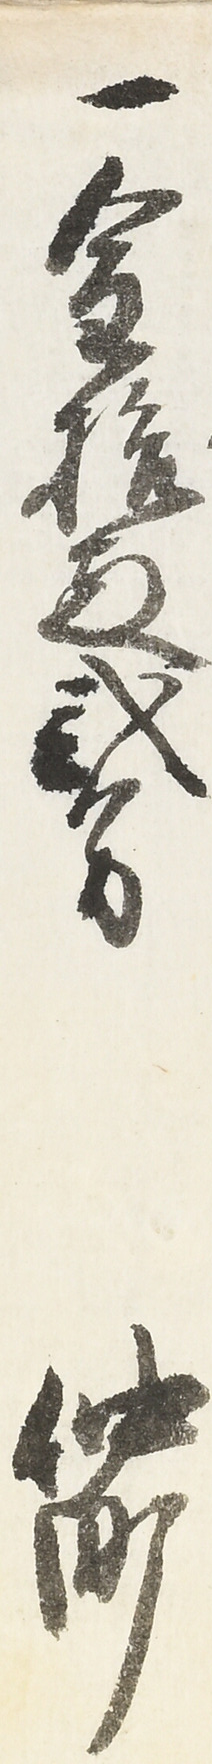一金拾両弐分仲町
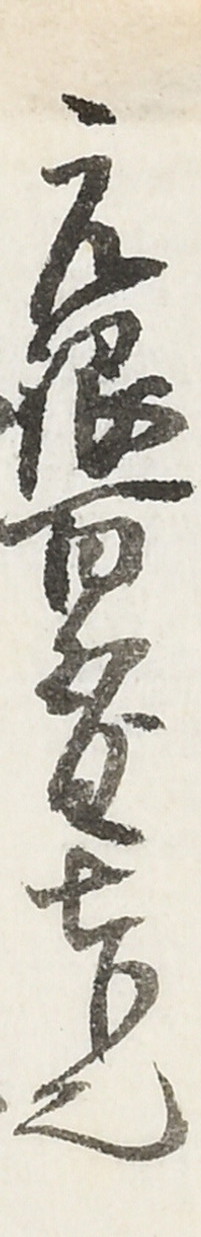元銀百五匁七分也
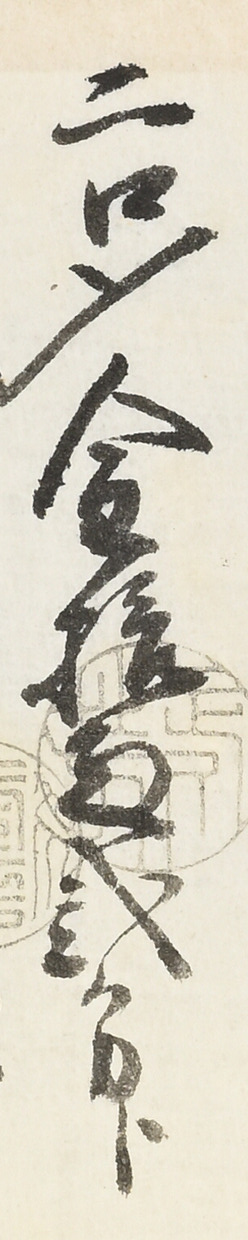二口〆金拾両弐分ト
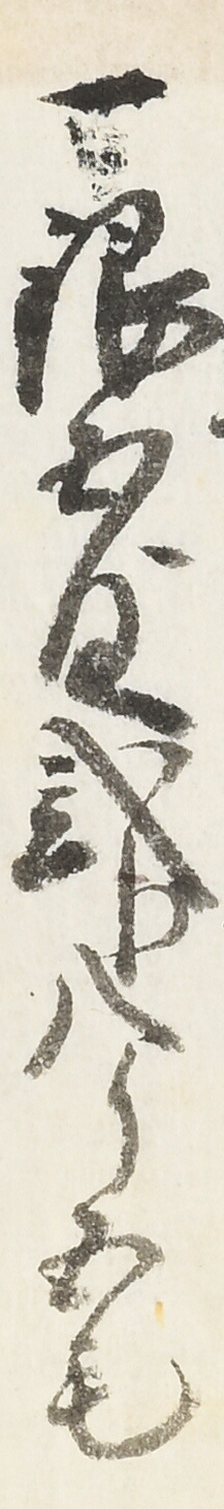一銀五匁弐分八厘五毛
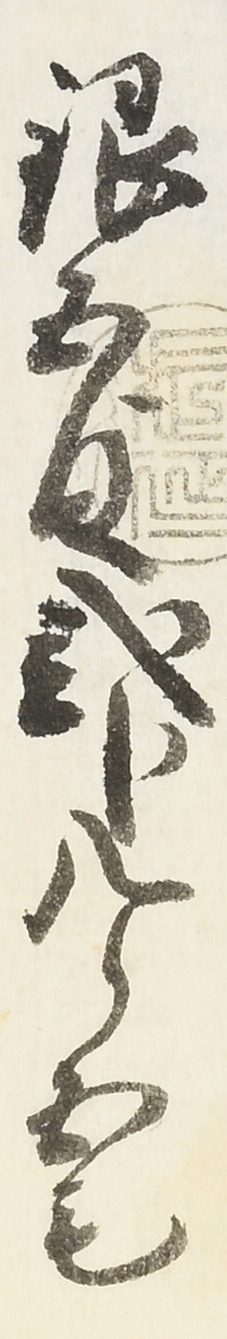銀五匁弐分八厘五毛
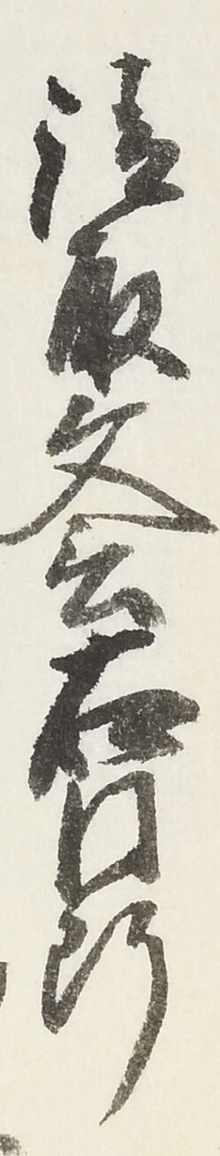請取文言右同断
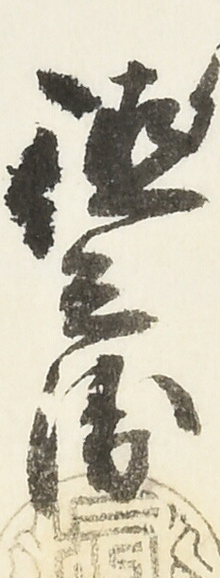徳兵衛
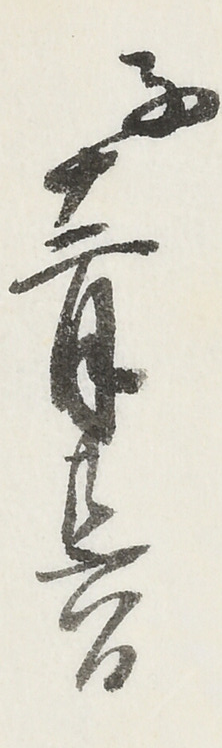十二月廿六日同断
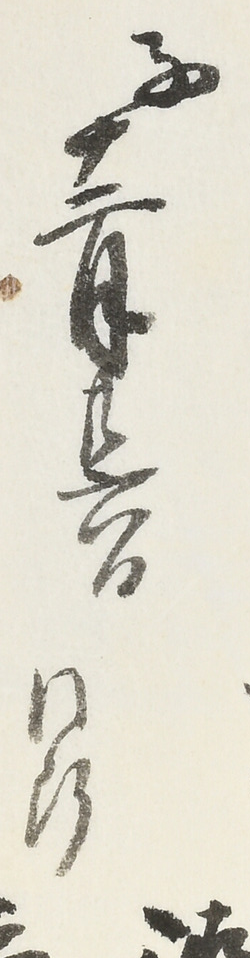十二月廿六日同断

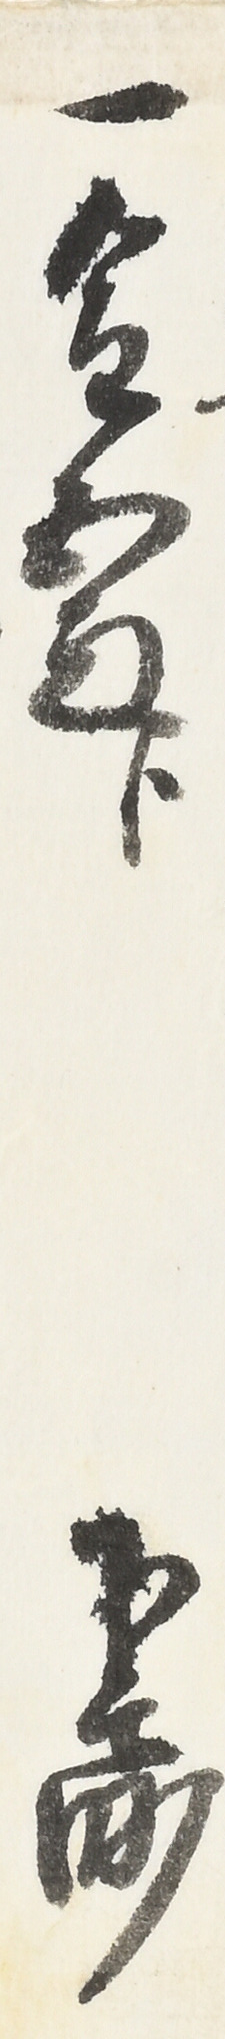一金五両ト下モ町
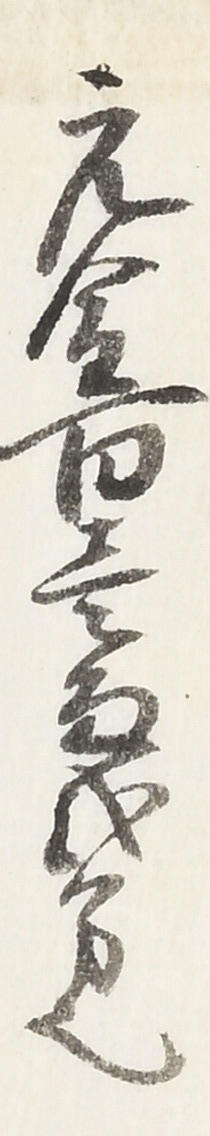元金百壱両弐分也
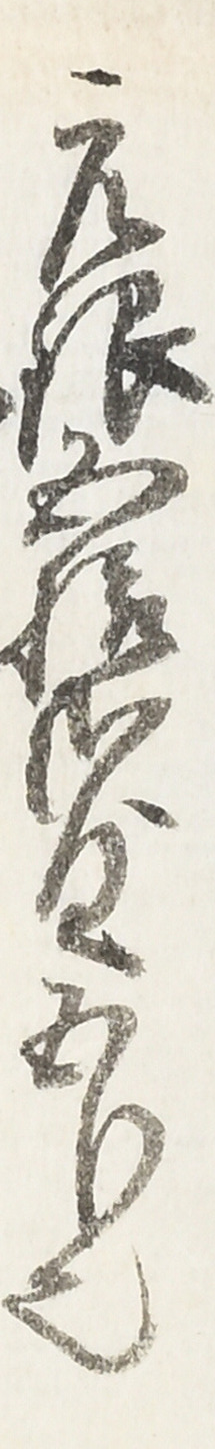元銀五拾弐匁五分也
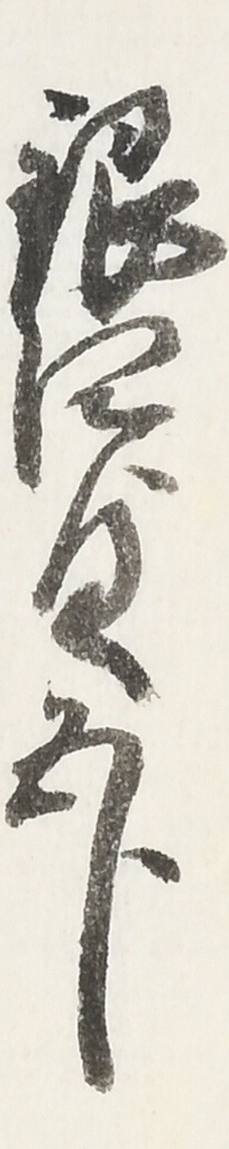銀四匁五分
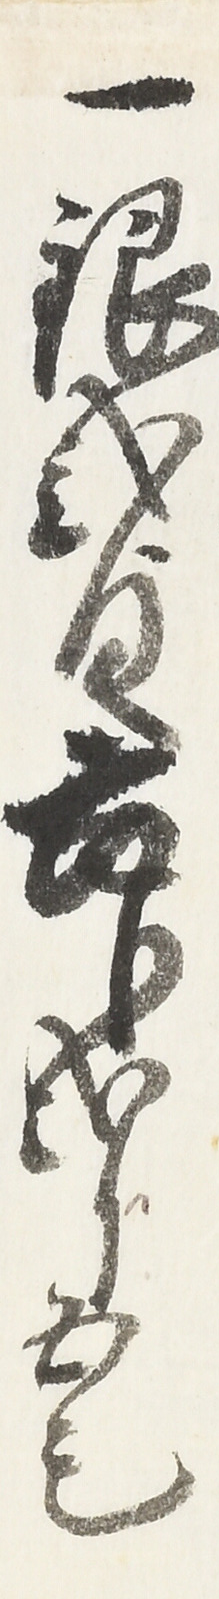一銀弐匁六分弐厘五毛
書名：御才覚金御利足割渡扣帳
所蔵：伊那市立高遠町図書館・合同会社AMANE
